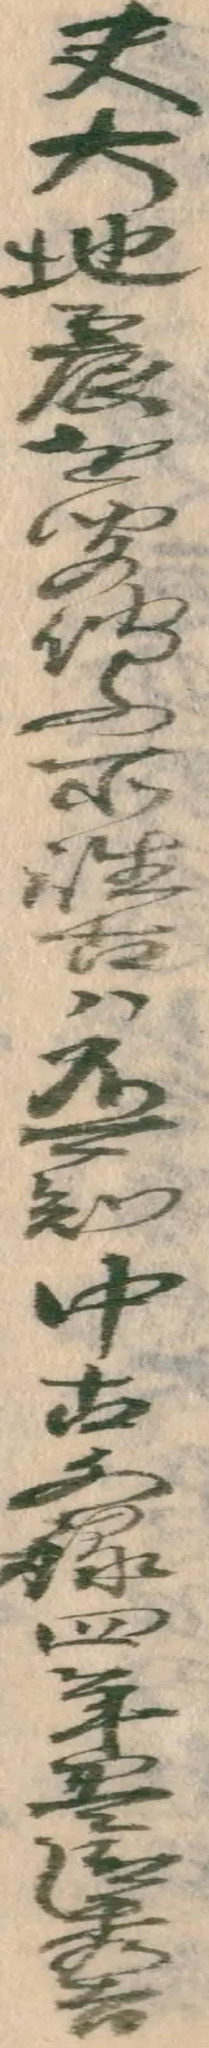夫大地震を聞伝ふ所往古ハ不可知中古文禄四年豊臣秀吉
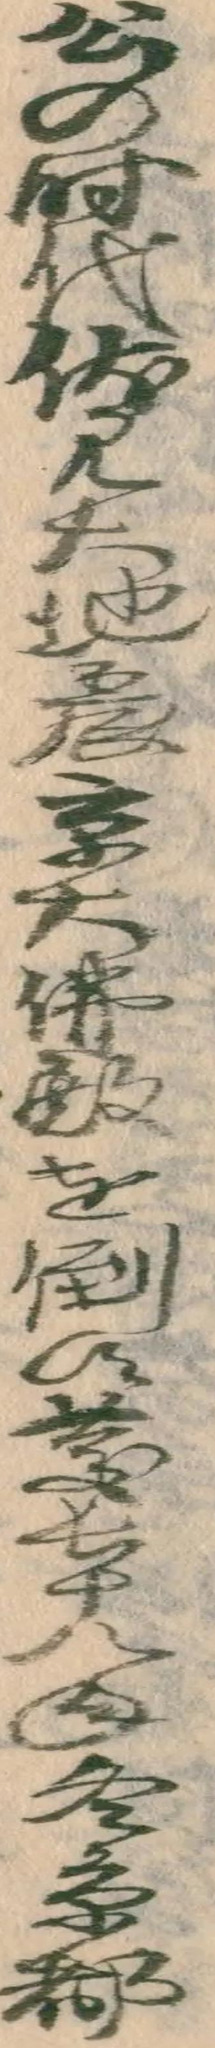公の時代伏見大地震京大仏殿を倒す慶長十八年冬京都
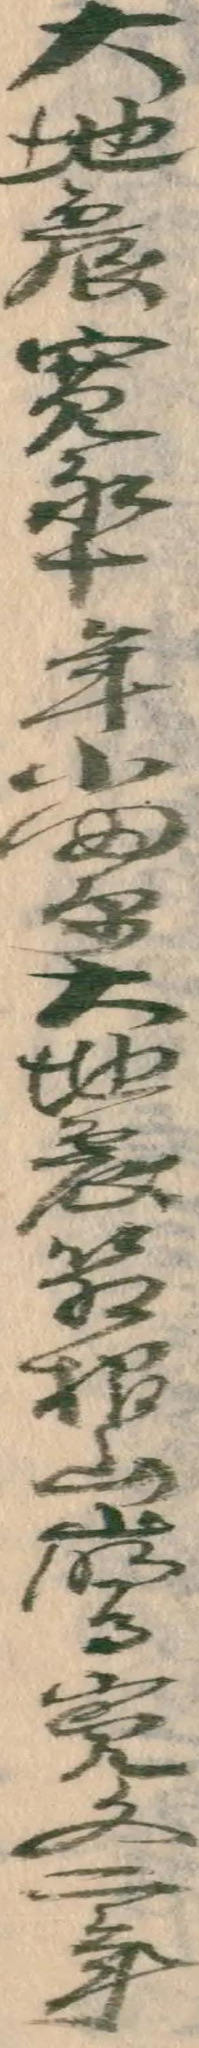大地震寛永十年小田原大地震箱根山崩る寛文二年
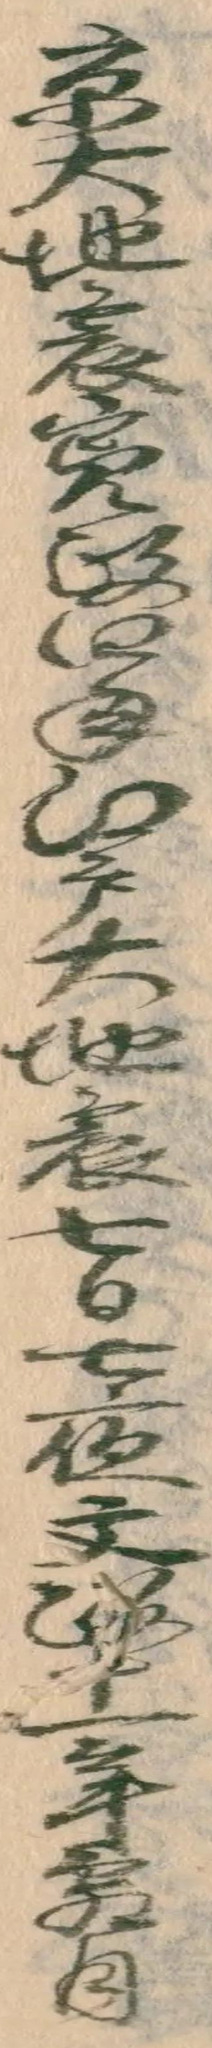京大地震寛政四年江戸大地震七日七夜文政十年霜月
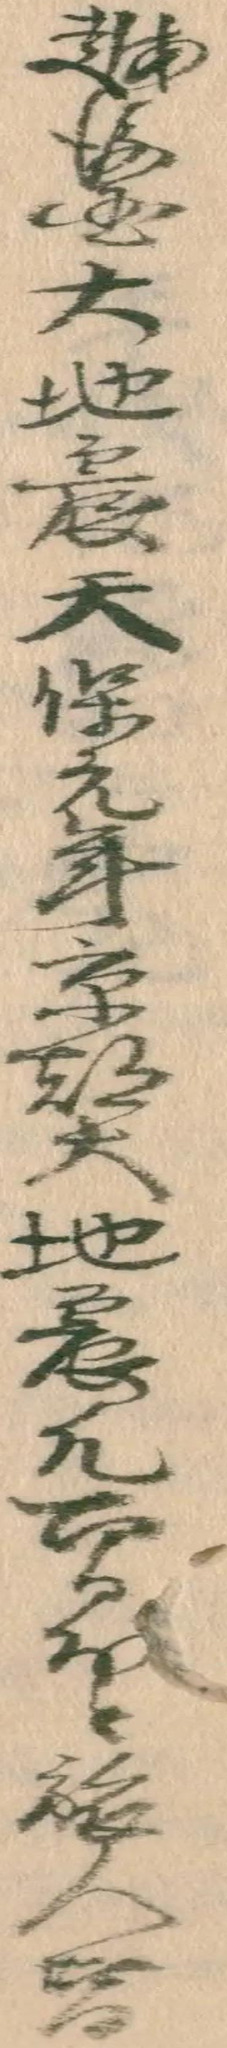越後国大地震天保元年京都大地震凡百日ほと旅人皆
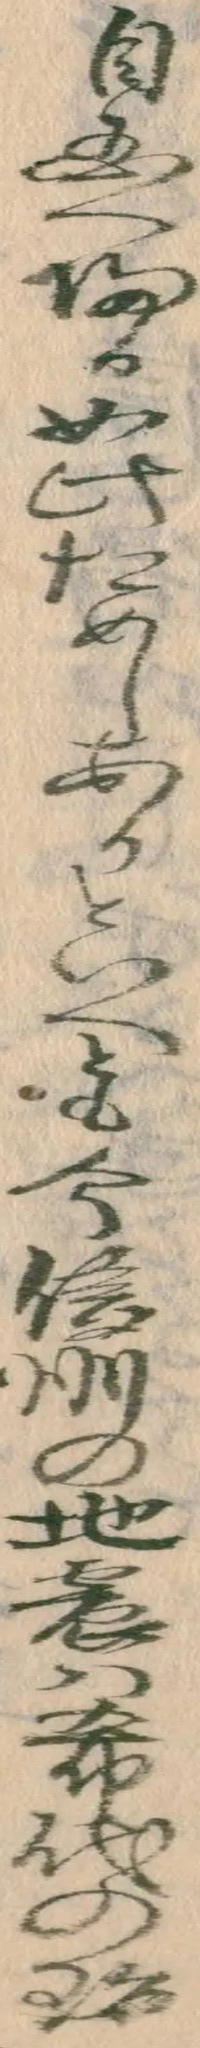自国へ帰る如此ためしありといへとも今信州の地震ハ希代の珍
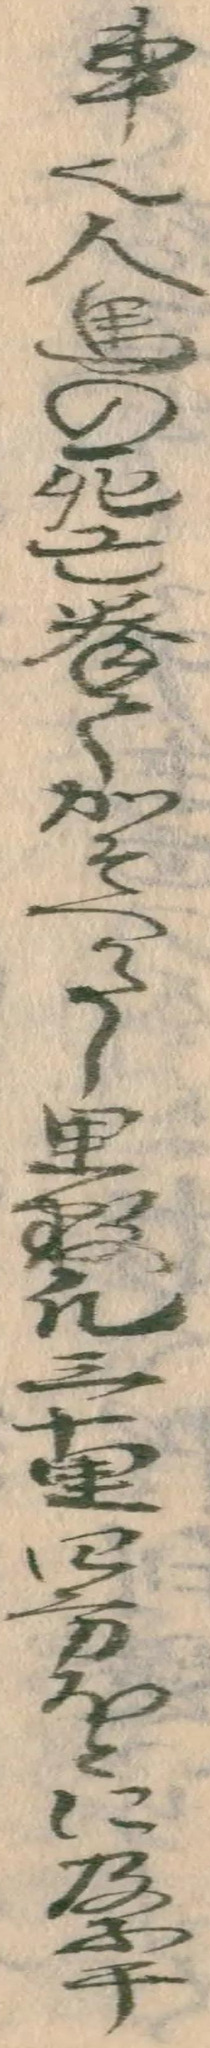事也人馬の死亡挙げてかそへかたし理数凡三十里四方ほとに及ふ漢字干
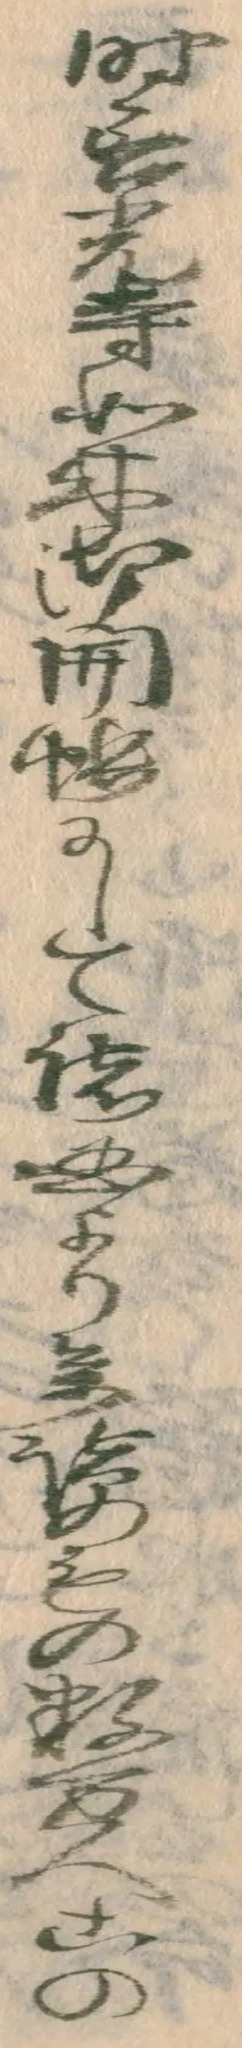時善光寺如来御開帳にて諸国より参詣もの数万人この
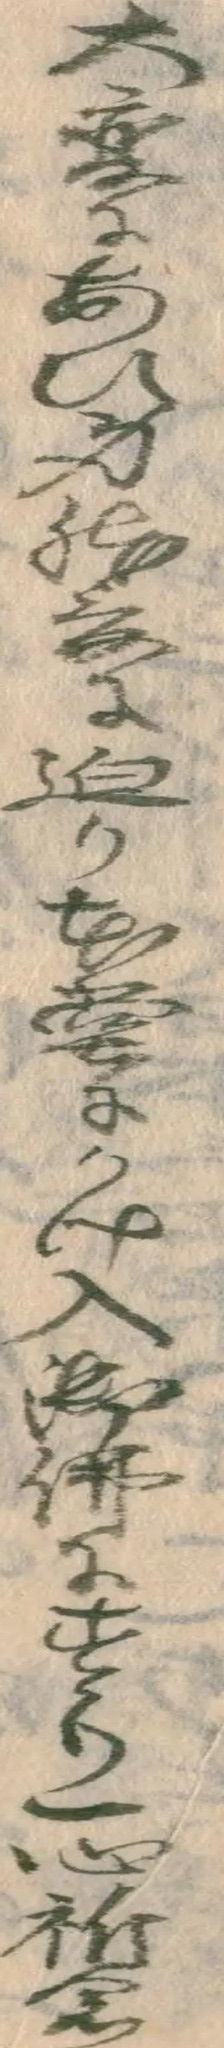大変にあひ身体茲に迫り本堂にかけ入御仏にすかり一心祈念
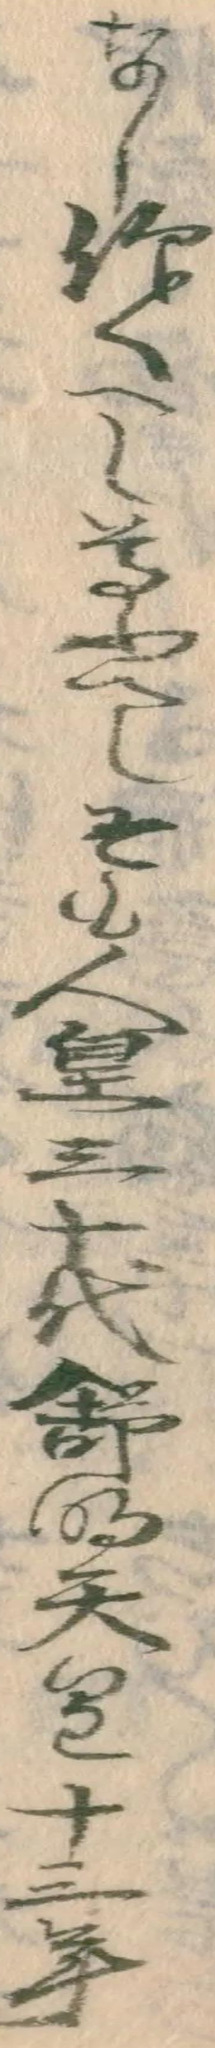なし仰くへし尊ふへしそも人皇三十代欽明天皇十三年
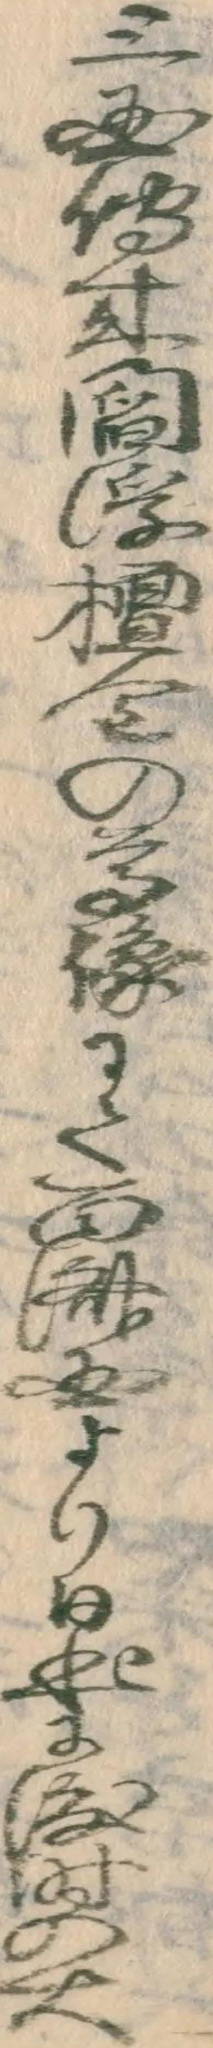三国伝来閻浮檀金の尊像にて百済国より日本に渡時の大
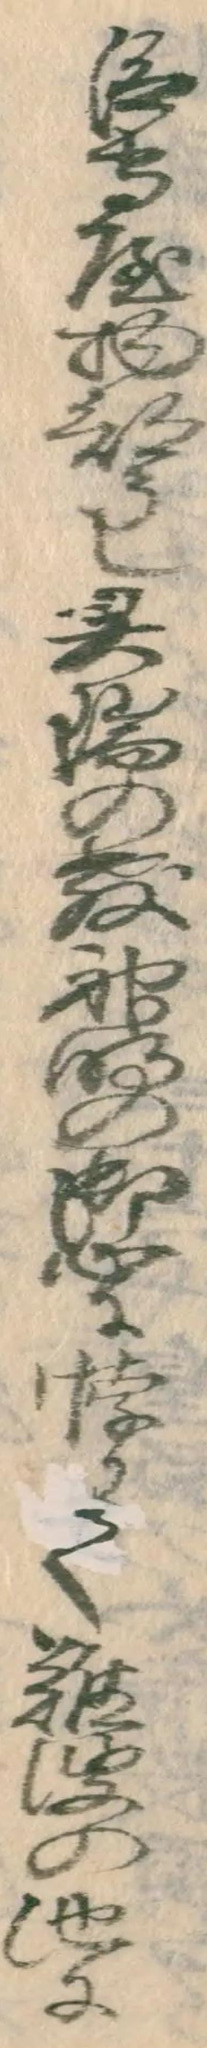臣守屋物部うし異端の処神明の御心に憚りて難波の池に
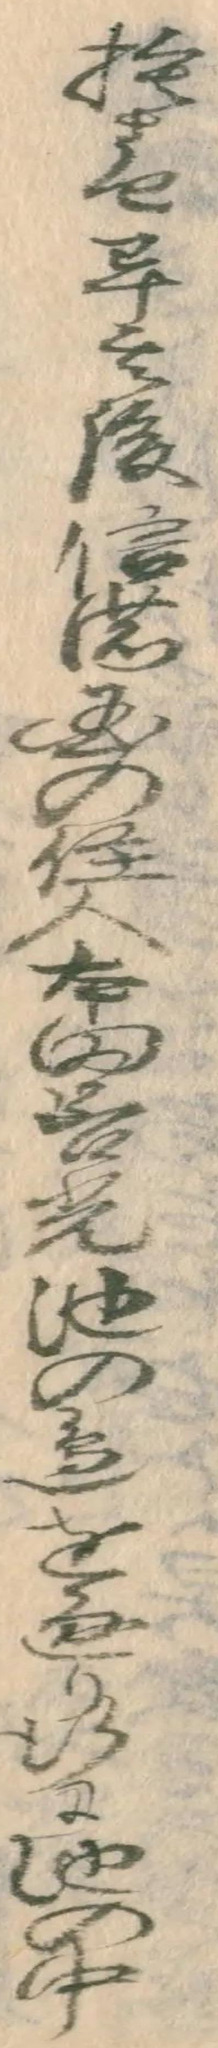捨させ畢其後信濃国の住人本田善光池の辺を通り行に池の中
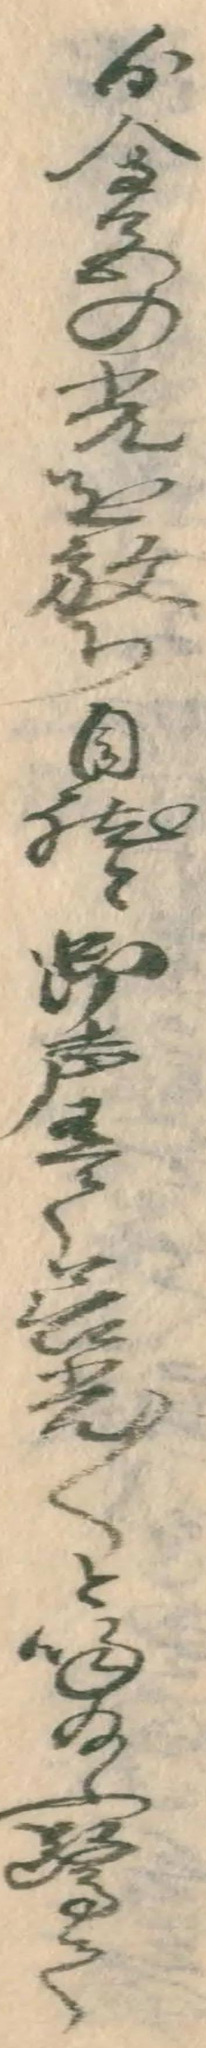ゟ金色の光を放ち自然と御声て善光くと呼給ふ驚て

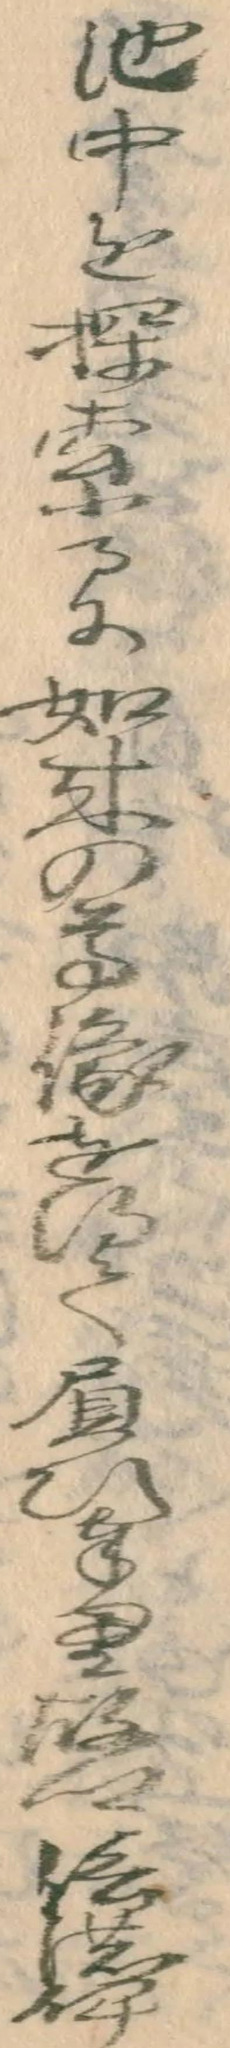池中を探索るに如来の尊像を得て負ひ奉故郷信濃伊
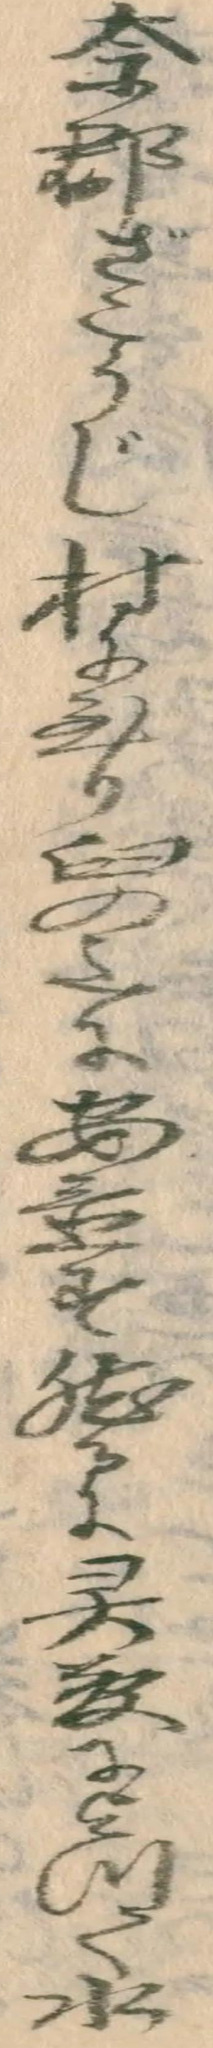奈郡ざこうじ村に至り臼の上に安置す然るに霊教によつて水
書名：信州大地震之記
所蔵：国立国会図書館 National Diet Library, JAPAN
